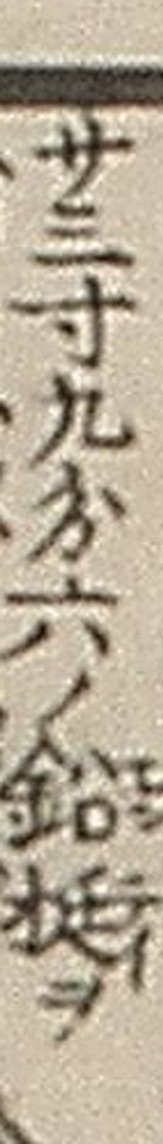サ三寸九分六ノ鉛挺ヲ
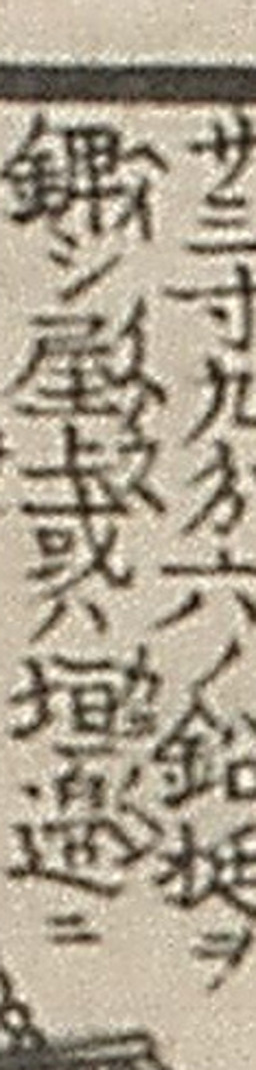錍シ屋上或ハ垣邊ニ
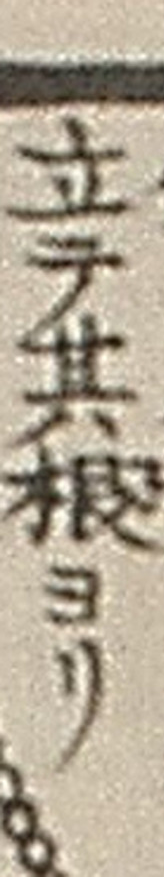立テ其根ヨリ
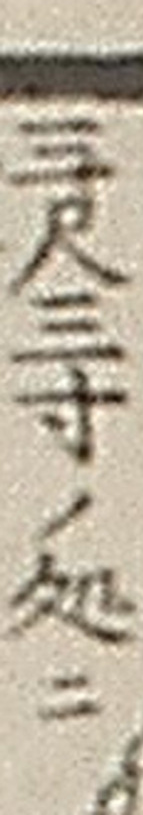三尺三寸ノ処ニ
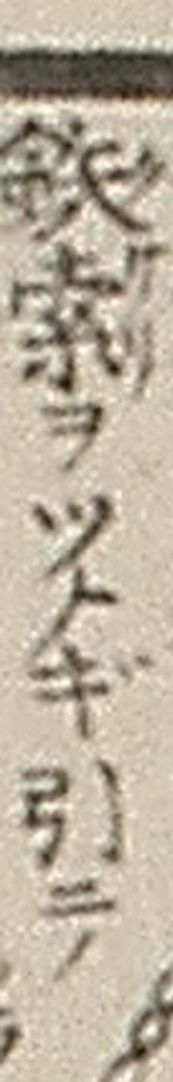鉄索ヲツナギ引テ
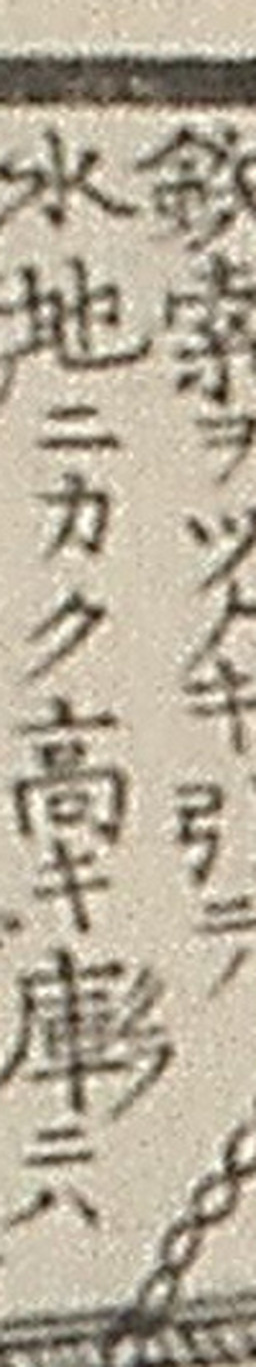水地ニカク高キ庫ニハ
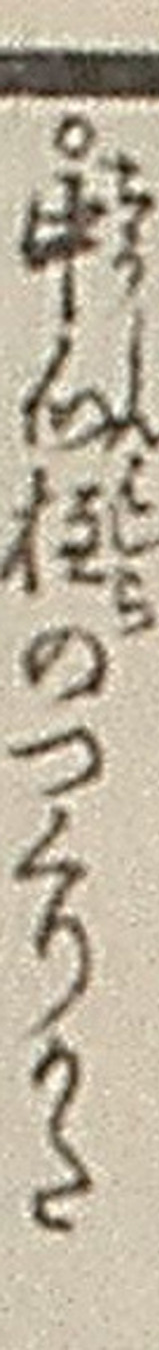○中心柱のつくりかた
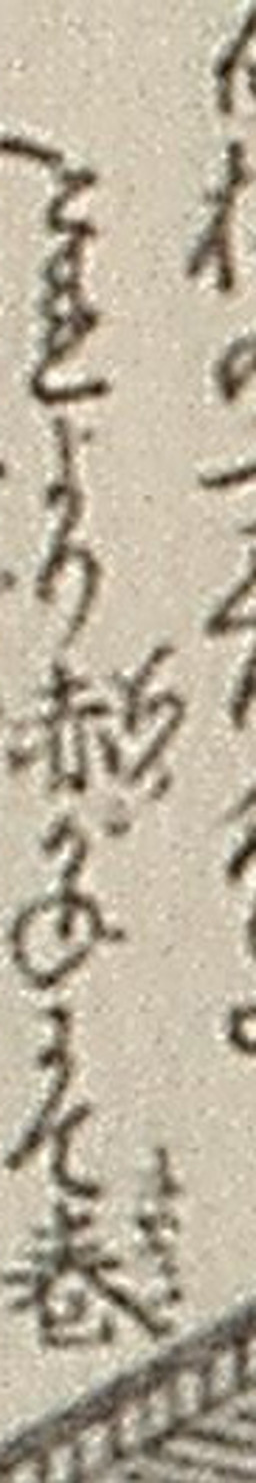これより赤がねにて巻
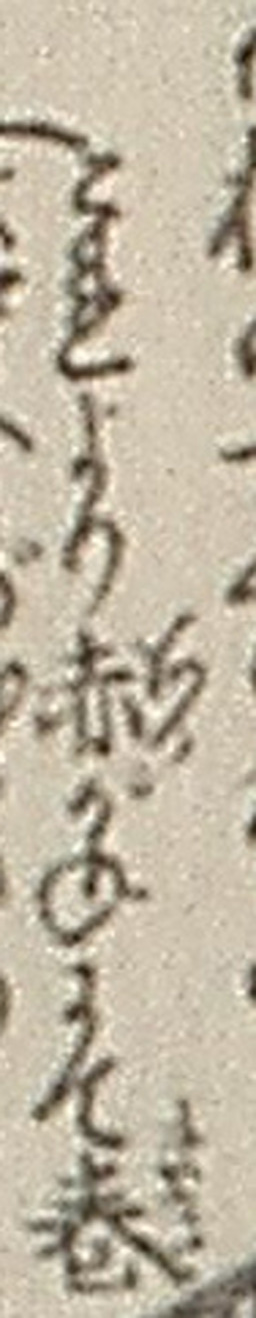これより赤がねにて巻
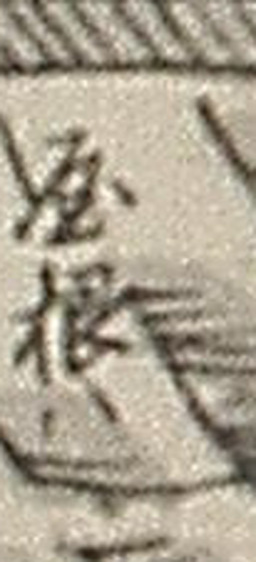屋根は
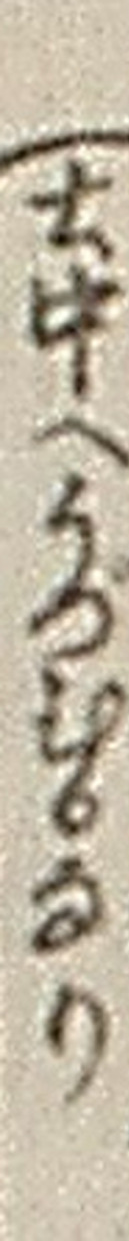土中へうづむるなり
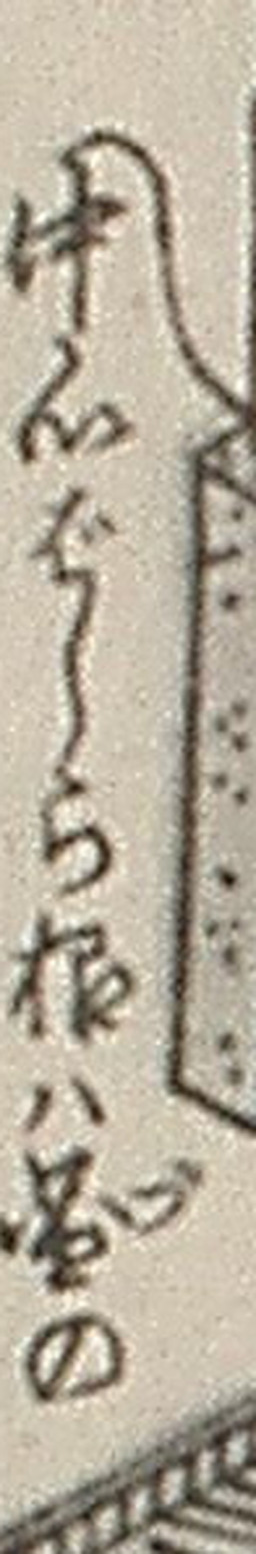中心ばしら根は図の
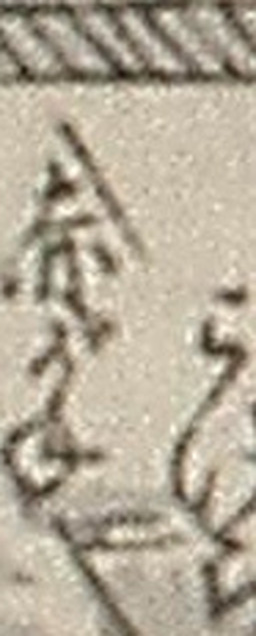赤がね
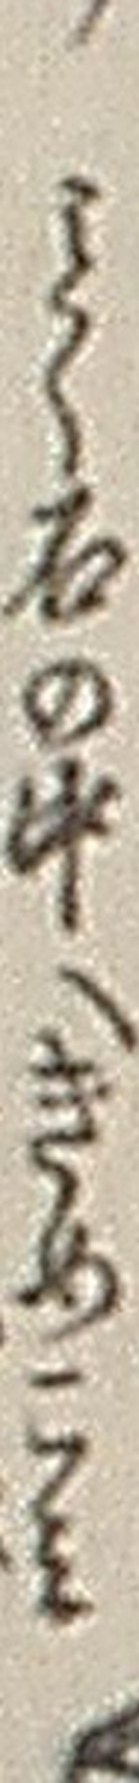ことく石の中へきめこみ
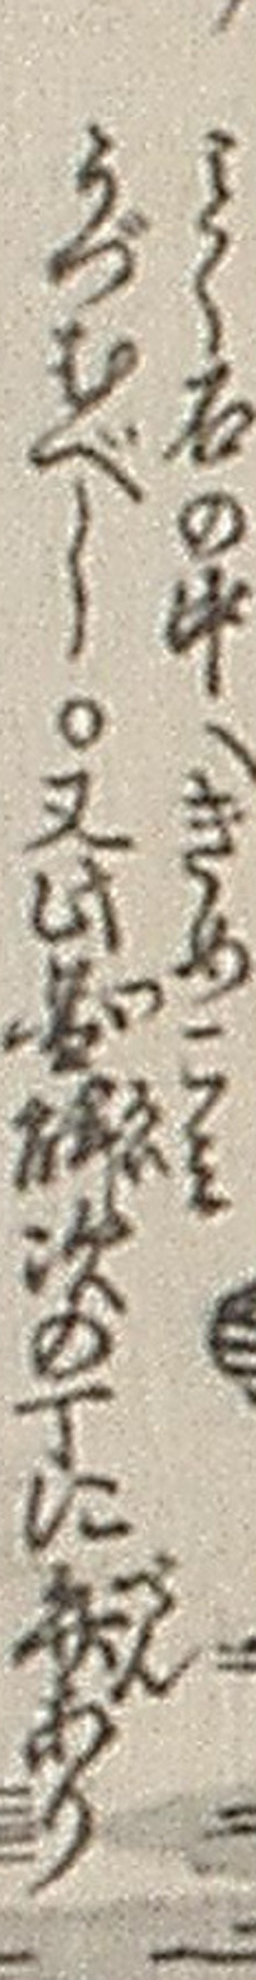うづむべし○又此図解次の丁に弁あり

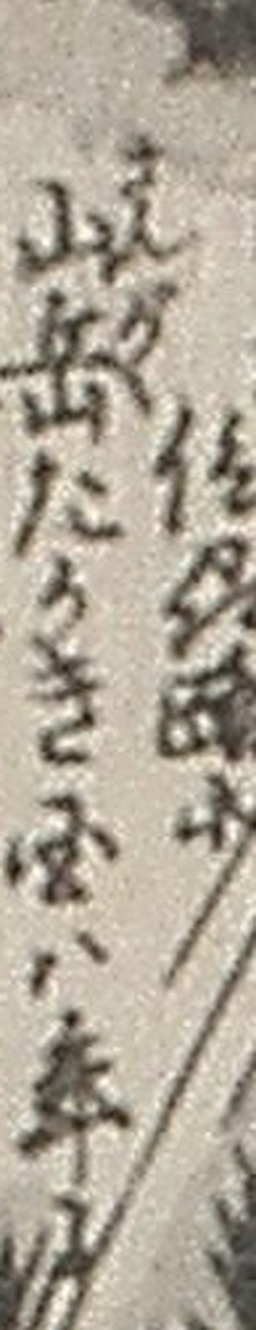山岳たかき国は年に
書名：大地震暦年考　全
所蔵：東京大学地震研究所図書室 Earthquake Research Institute Library, The University of Tokyo, JAPAN
